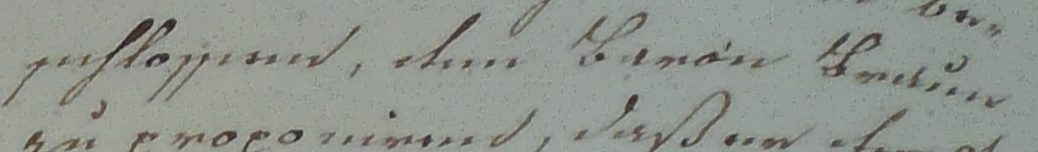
schlossen, dem Baron Braun
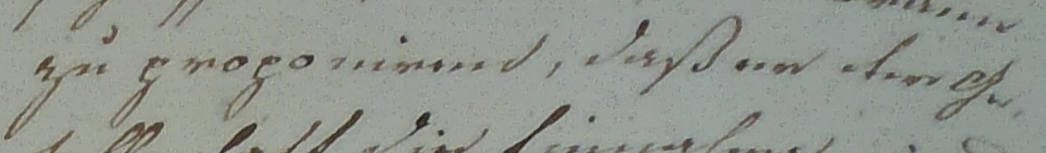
zu proponiren, daß er der Ge¬
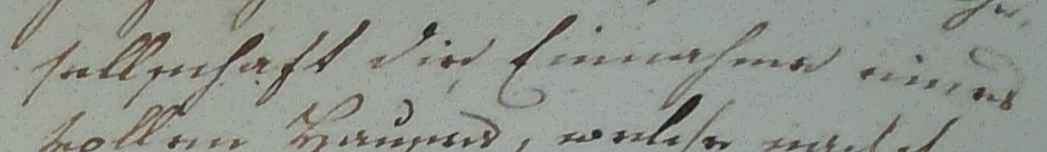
sellschaft die Einnahme eines
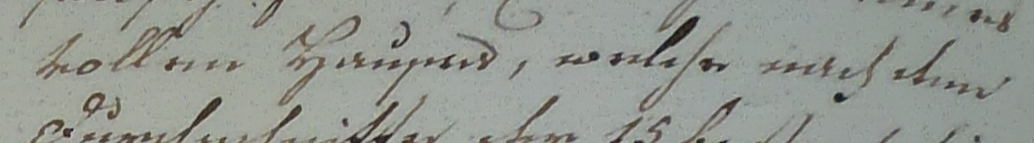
vollen Hauses, welche nach dem
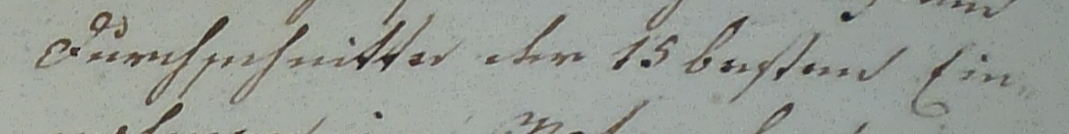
Durchschnitte der 15 besten Ein¬
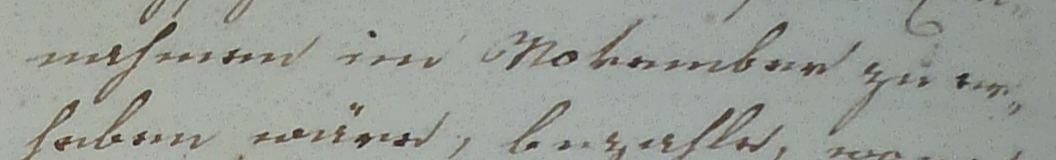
nahmen im November zu er¬
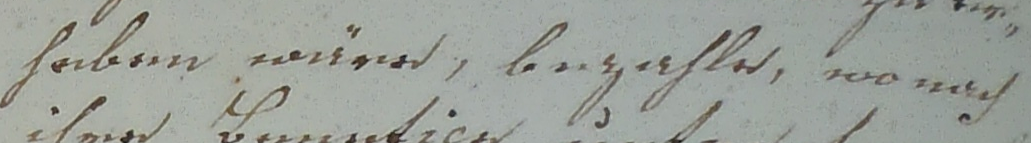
heben wäre, bezahle, wo nach
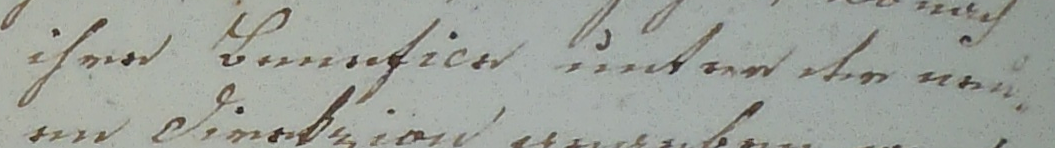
ihre Benefice unter der neu¬
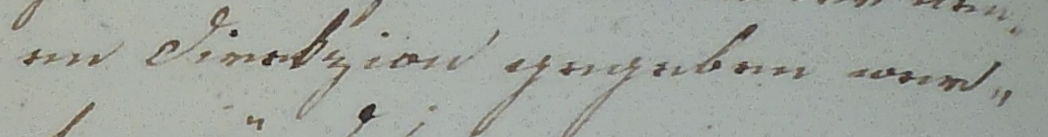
en Direkzion gegeben wer¬
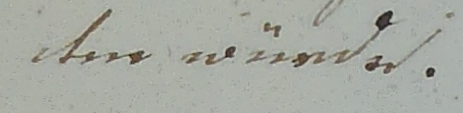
den würde.
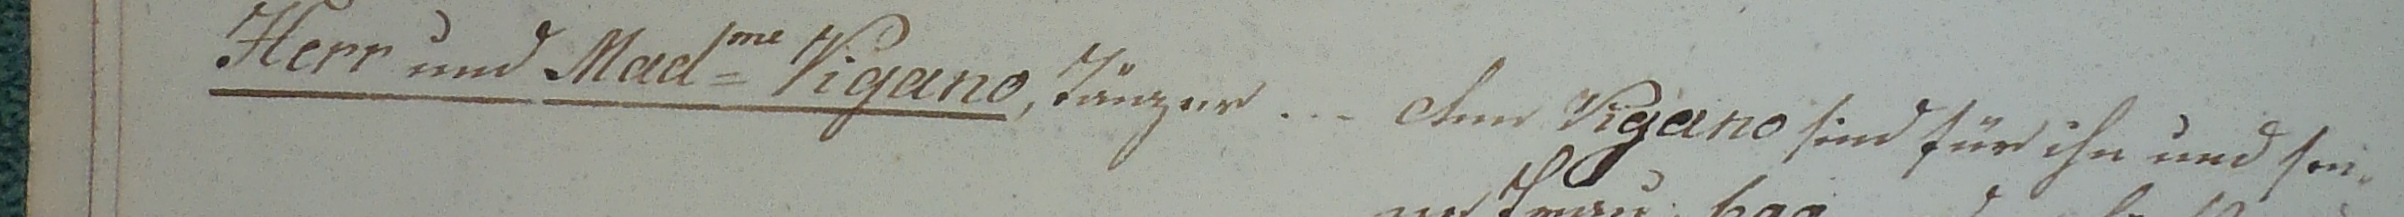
Herr und Madm͇e Vigano, Tänzer … Dem Vigano sind für ihn und sei¬
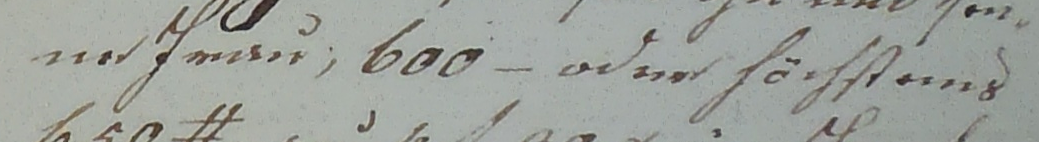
ne Frau, 600 – oder höchstens
